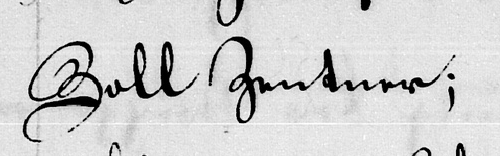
Zoll Zentner;
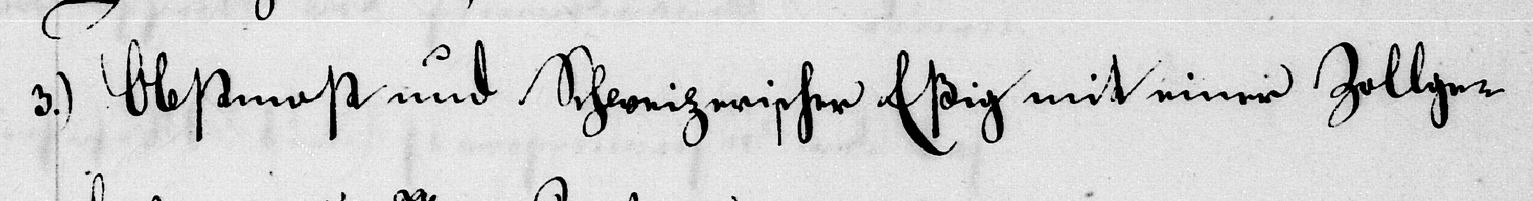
3.) Obstmast und Schweizerischer Eßig mit einer Zollge¬
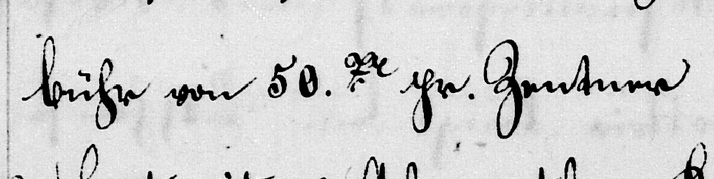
bühr von 50. Xr pr. Zentner
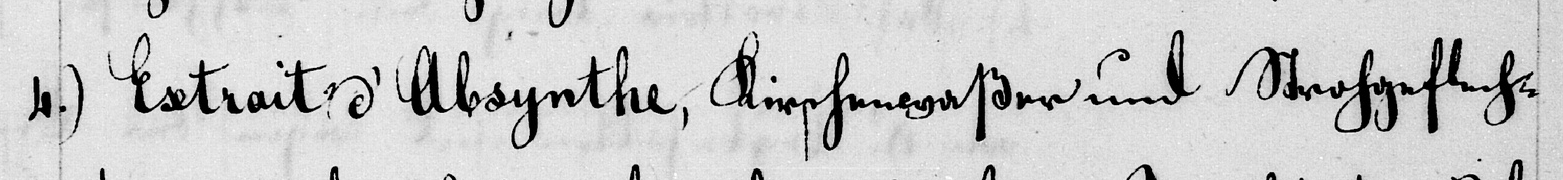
4.) Exrait d’Absynthe, Kirschenwaßer und Strohgeflech¬
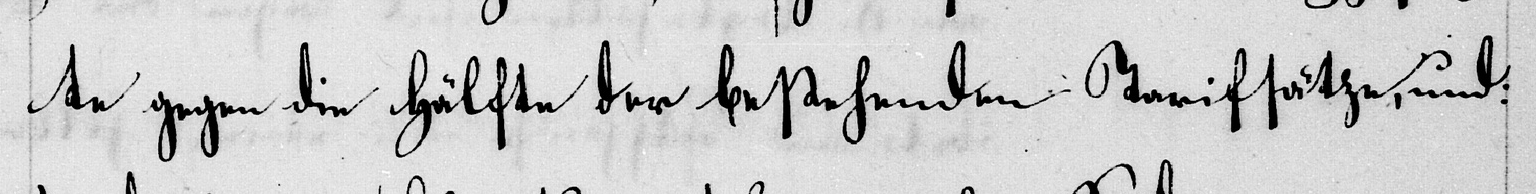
te gegen die Hälfte der bestehenden Tarifsätze, und:
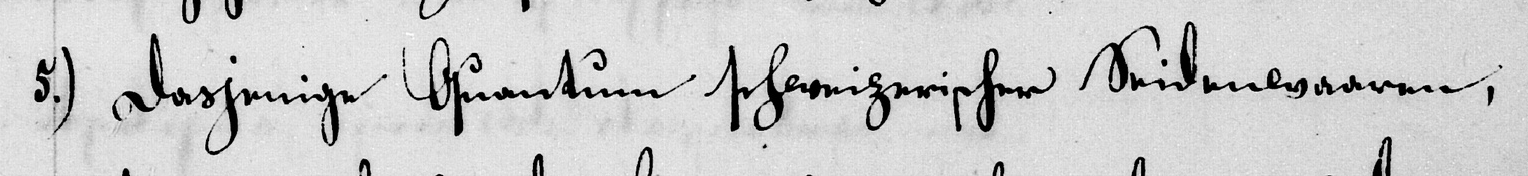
5.) Dasjenige Quantum schweizerischer Seidenwaaren,
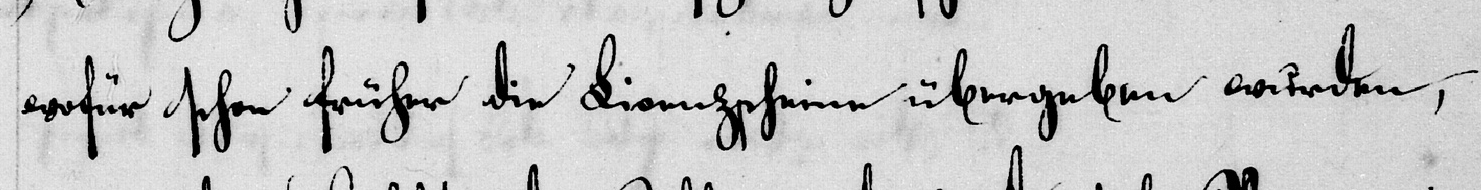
wofür schon früher die Licenzscheine übergeben wurden,
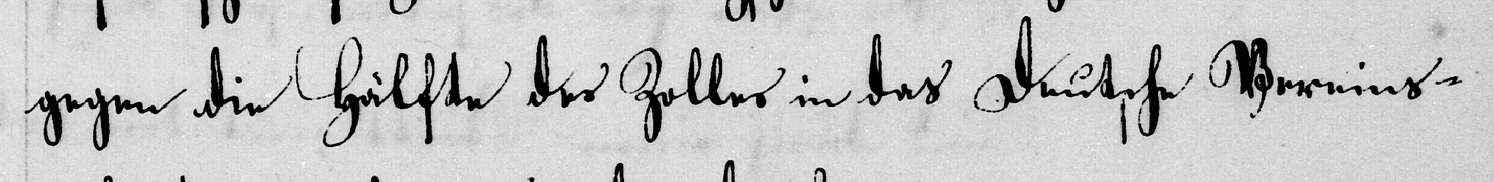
gegen die Hälfte des Zolles in das Deutsche Vereins¬
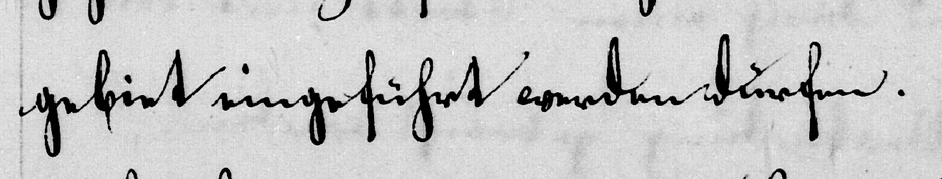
gebiet eingeführt werden dürfen.
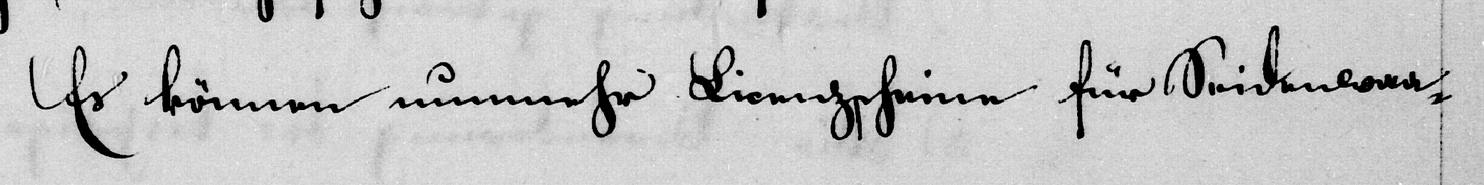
Es können nunmehr Licenzscheine für Seidenwaa-
